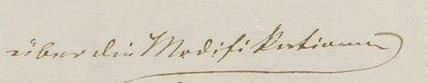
über die Modifikationen,
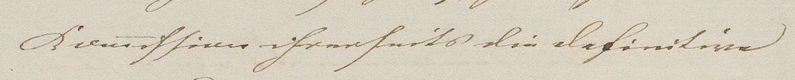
Kommission ihrerseits die definitive
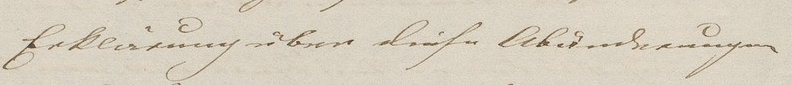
Erklärung über diese Abänderungen
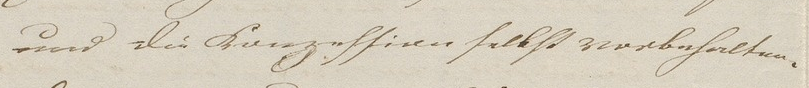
und die Konzession selbst vorbehalten.
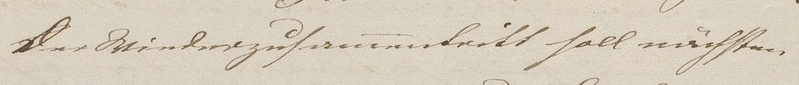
Der Wiederzusammentritt soll nächsten
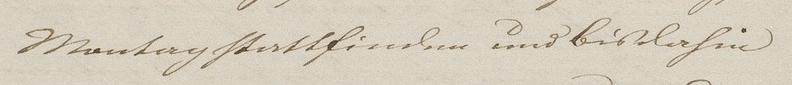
Montag stattfinden und bis dahin
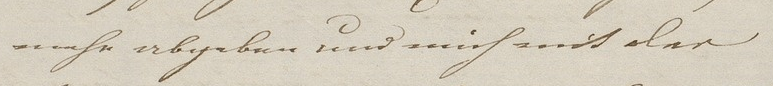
mehr abgeben und mich mit der
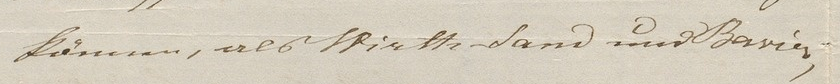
können, als Wirth-Sand und Bavier,
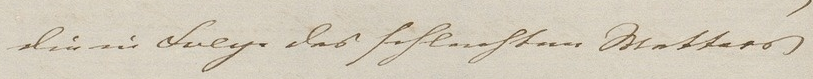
die in Folge des schlechten Wetters
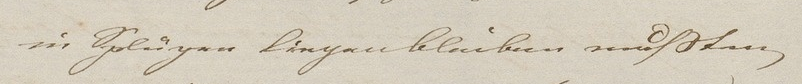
in Splügen liegen bleiben mußten,
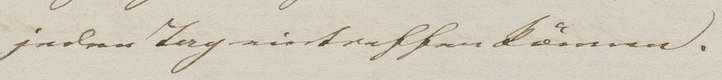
jeden Tag eintreffen können.
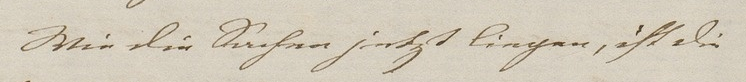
Wie die Sachen jetzt liegen, ist die
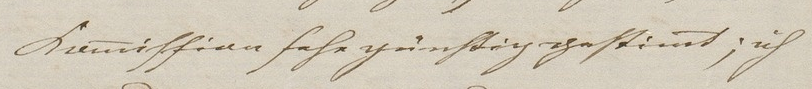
Kommission sehr günstig gestimmt; ich
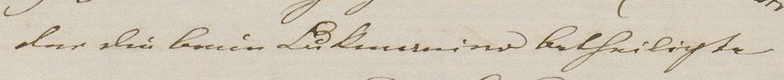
der die beim Lukmanier betheiligte
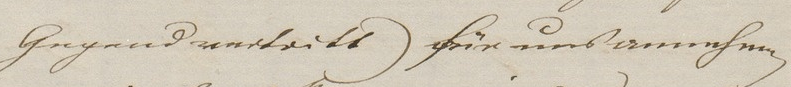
Gegend vertritt) für uns annehme,
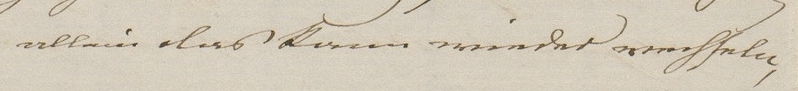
allein das kann wieder wechseln,
